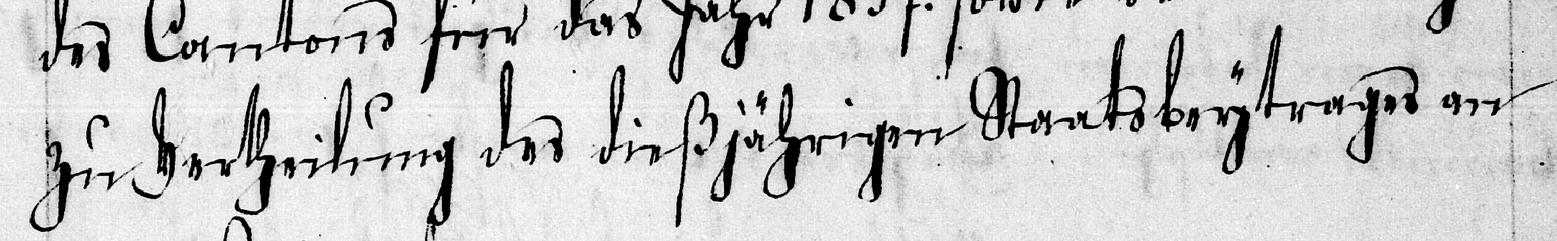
zu Vertheilung des dießjährigen Staatsbeytrages an
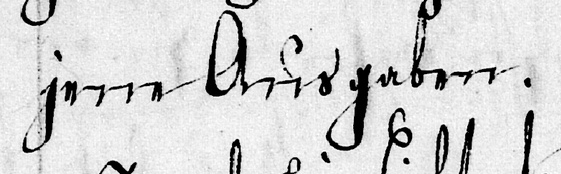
jene Ausgaben.
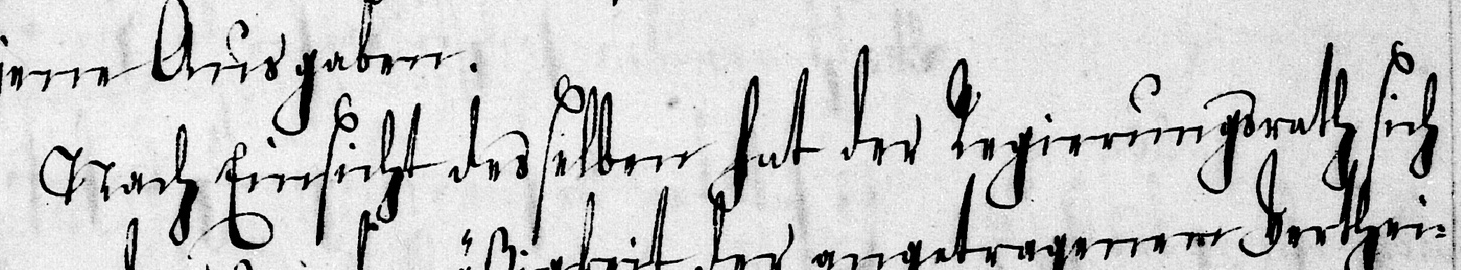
Nach Einsicht desselben hat der Regierungsrath sich
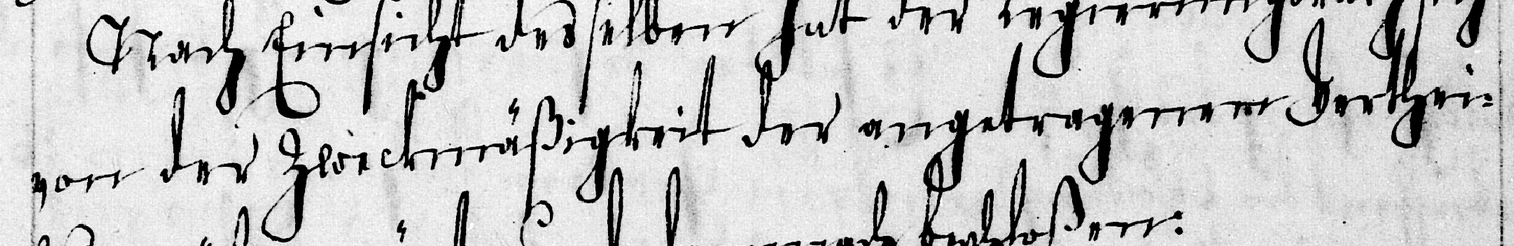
von der Zweckmäßigkeit der angetragenen Verthei¬
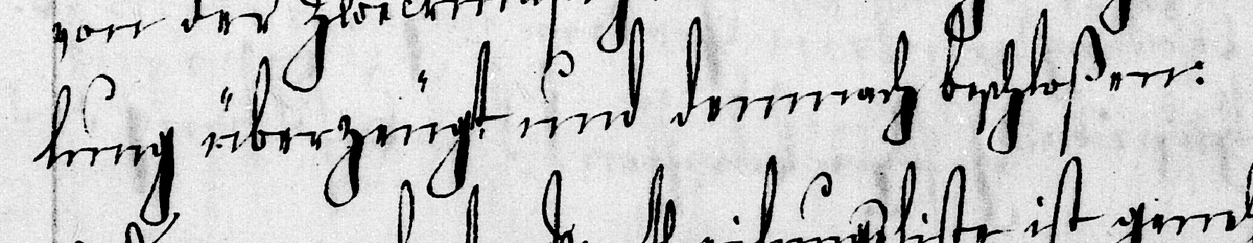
lung überzeugt und demnach beschloßen:
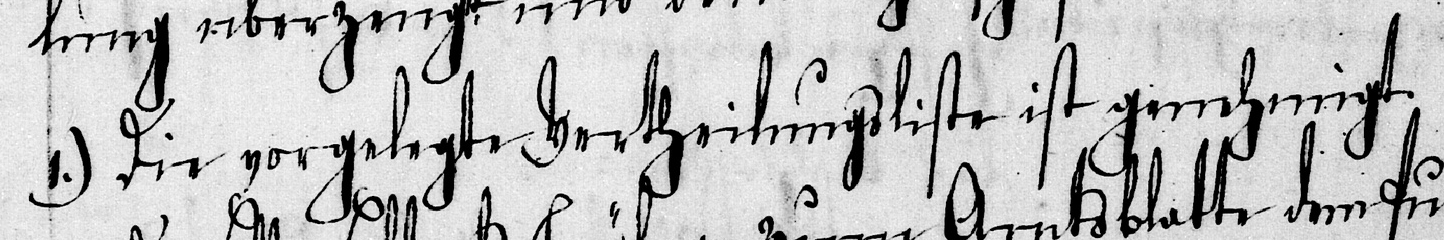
1.) Die vorgelegte Vertheilungsliste ist genehmigt.
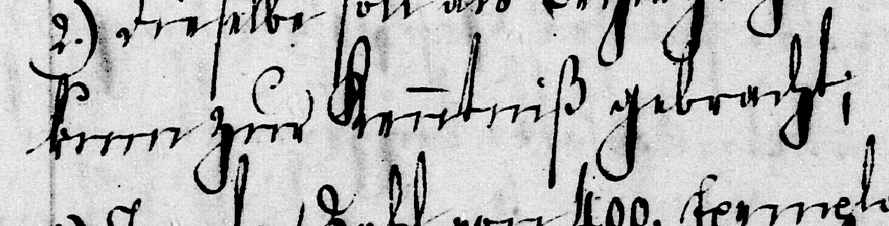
kum zur Kenntniß gebracht;
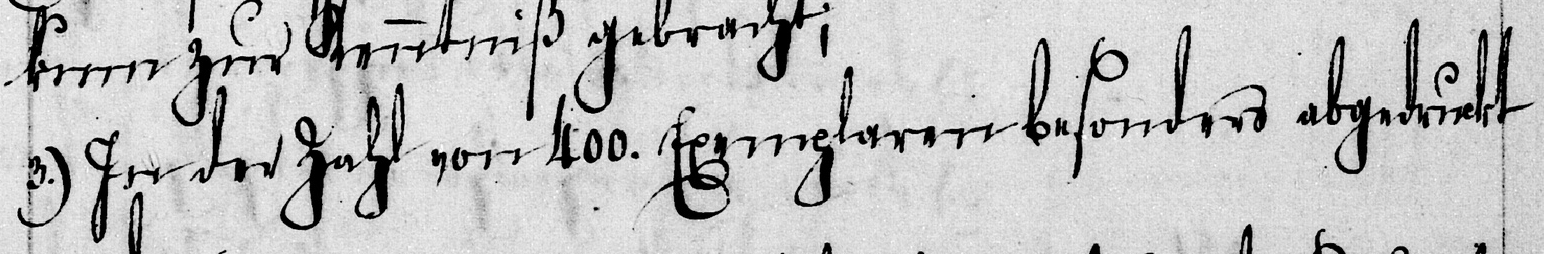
3.) In der Zahl von 400. Exemplaren besonders abgedruckt
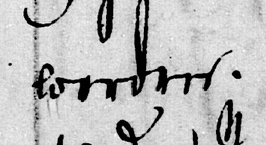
werden.
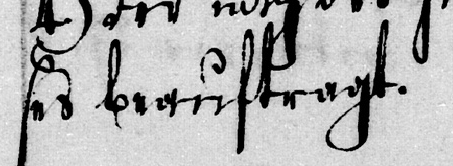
es beauftragt.
